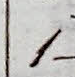1
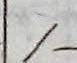1
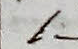1
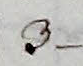3
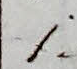1
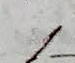1
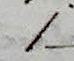1
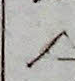1
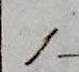1
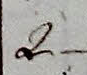2
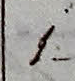1
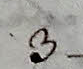3
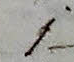1
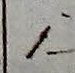1
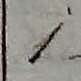1
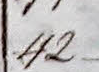42
